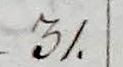31.
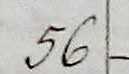56
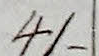41
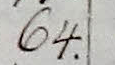64.
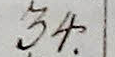34.
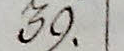39.
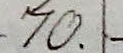70.
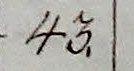43
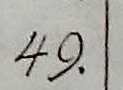49.
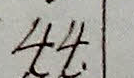44.
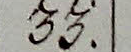33.
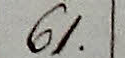61.
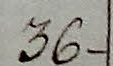36
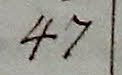47
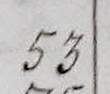53
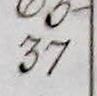37
